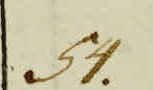54.
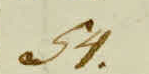54.
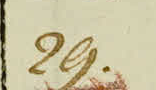29.
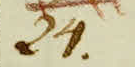24.
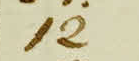12
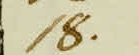18.
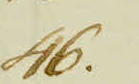46.
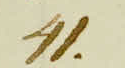41.
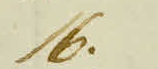16.
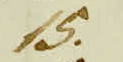15.
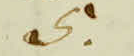5.
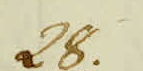28.
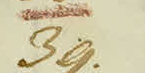39.
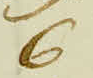6
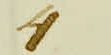4
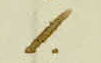1.
